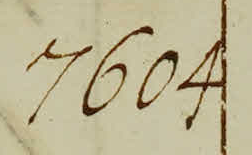7604
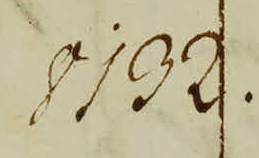8132
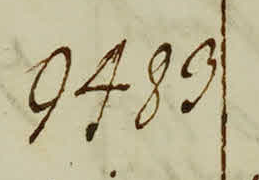9483
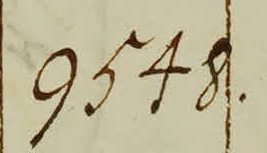9548
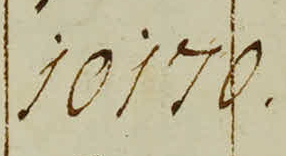10170
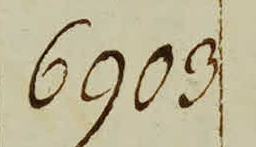6903
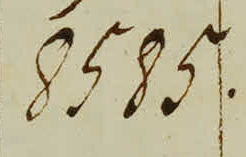8585
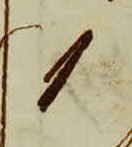1
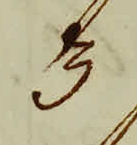3
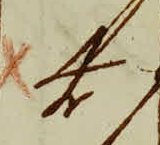4
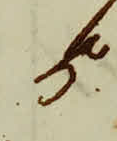5
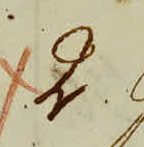2
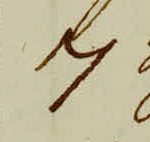7
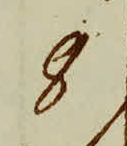8
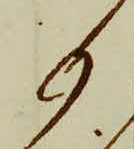9
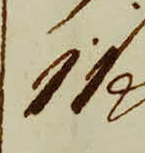11
